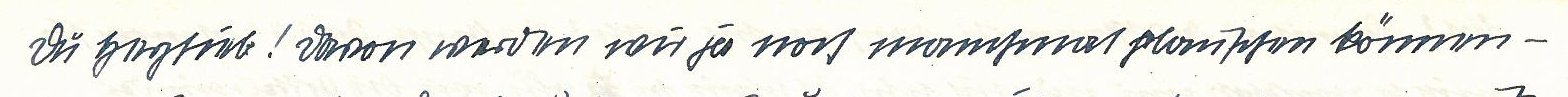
Du Herzlieb! Davon werden wir ja noch manchmal plauschen können –
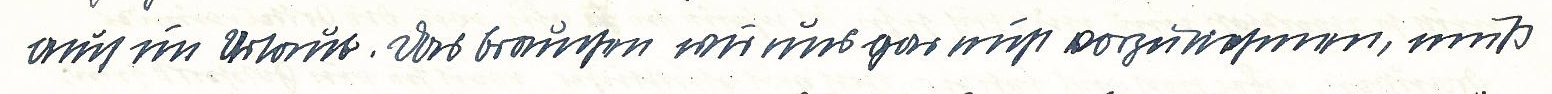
auch im Urlaub. Das brauchen wir uns gar nicht vorzunehmen, muß
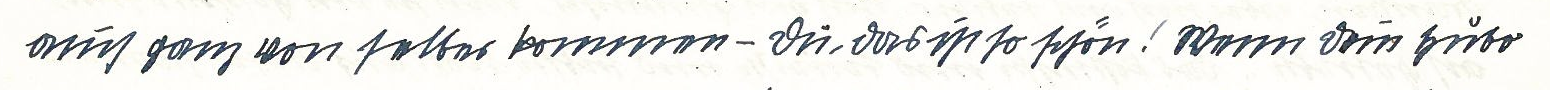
auch ganz von selber kommen – Du, das ist so schön! Wenn Dein Hubo
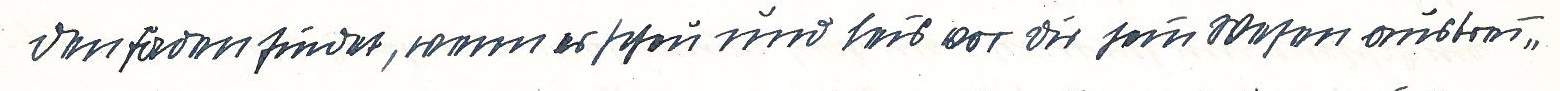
den Faden findet, wenn er scheu und leis vor Dir sein Wesen ausbrei¬
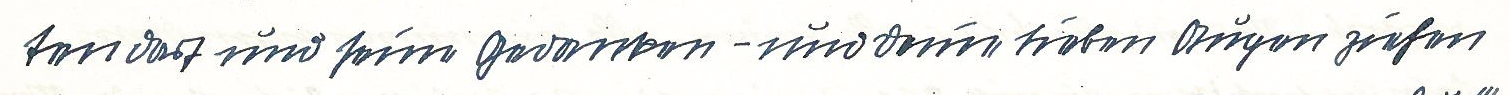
ten darf und seine Gedanken – und Deine lieben Augen ziehen
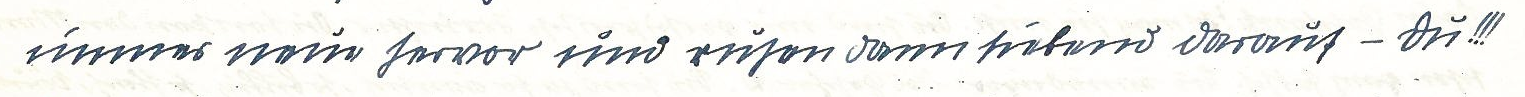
immer neue hervor und ruhen dann liebend darauf – Du!!!
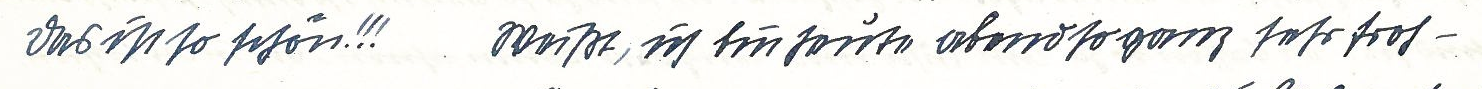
Das ist so schön!!! Weißt, ich bin heute abend so ganz sehr froh –
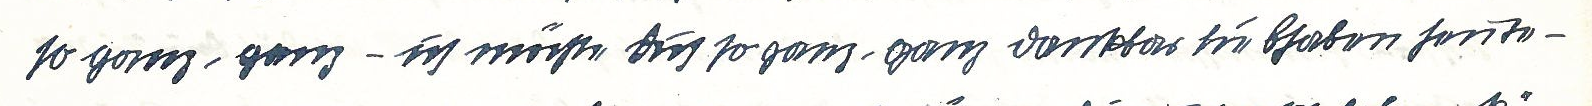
so ganz, ganz – ich möchte Dich so ganz – ganz dankbar liebhaben heute –
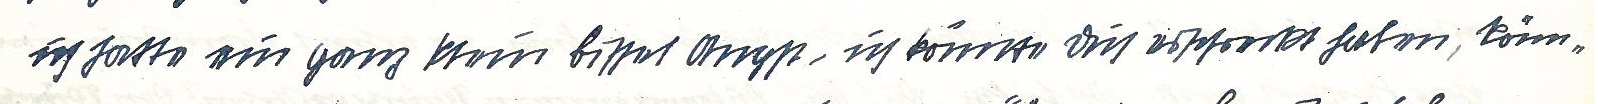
ich hatte ein ganz klein bissel Angst, ich könnte Dich erschreckt haben, könn¬
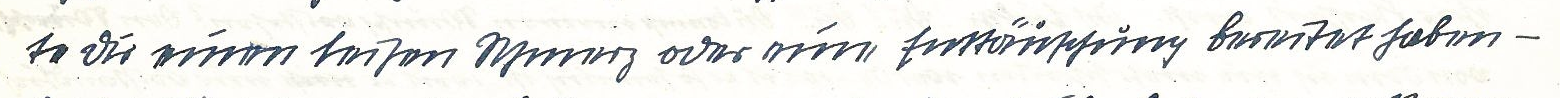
te Dir einen leisen Schmerz oder eine Enttäuschung bereitet haben –
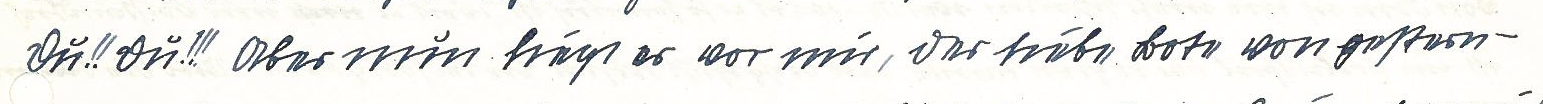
Du!! Du!!! Aber nun liegt vor mir, der liebe Bote von gestern –
